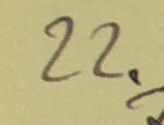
22
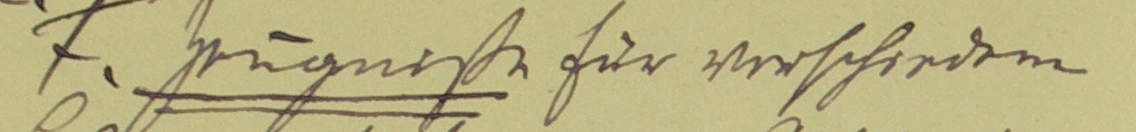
F.) Zeugniße für verschiedene
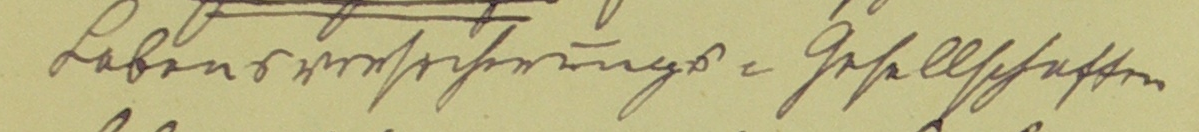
Lebensvesicherungs- Gesellschaften
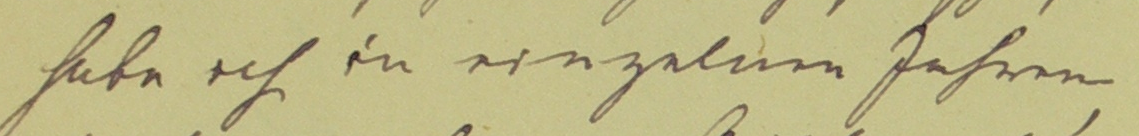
habe ich in einzelnen Jahre
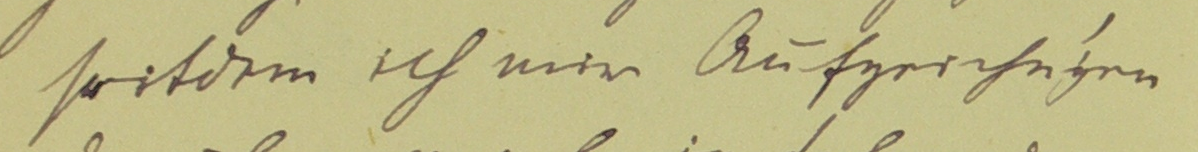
seitdem ich mir Aufzeichnungen
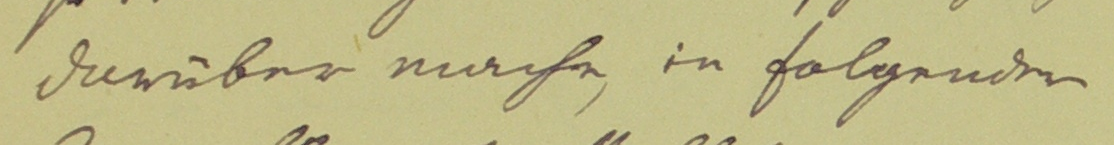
darüber mache, in folgender
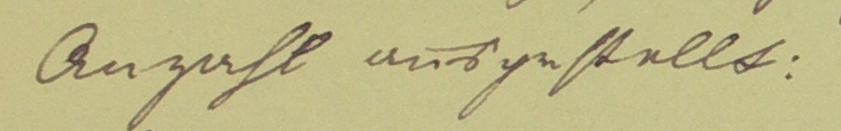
Anzahl ausgestellt:
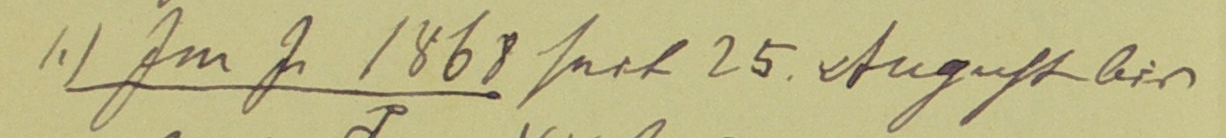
1) Im Jahre 1868 seit 25. August bis
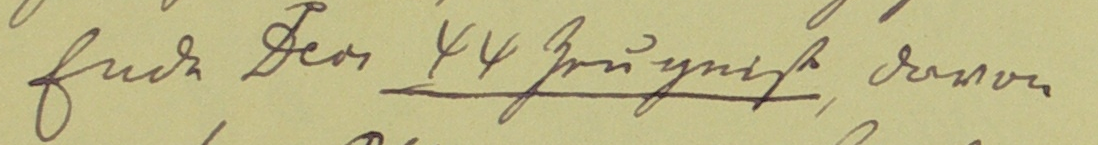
Ende Dec. 44 Zeugniße, davon
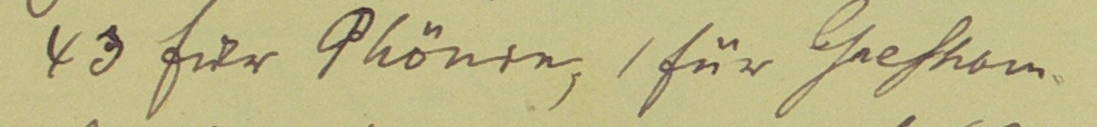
43 für Phönix, 1 für Hestony.
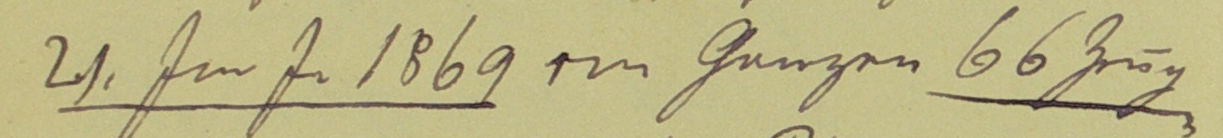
2) Im Jahre 1869 im ganzen 66 Zeug¬
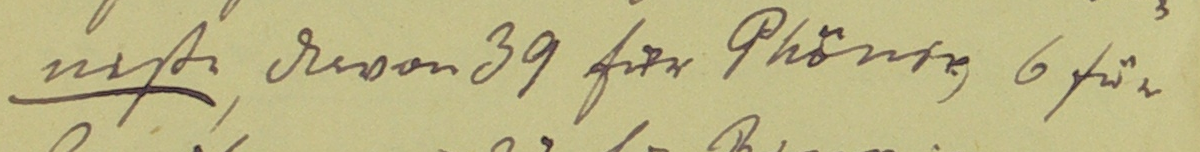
nißen , davon 39 für Phönix, 6 für
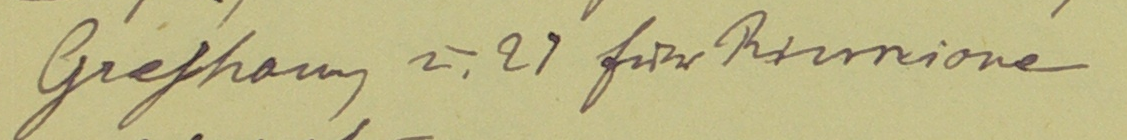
Hestony, und 27 für Riunione
